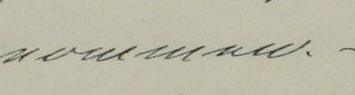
nommen.
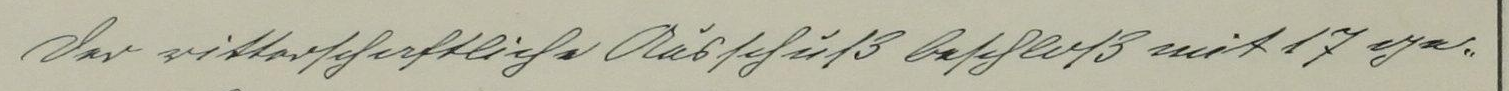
Der ritterschaftliche Ausschuß beschloß mit 17 ge-
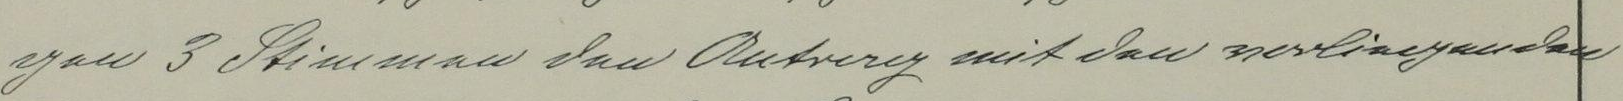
gen 3 Stimmen, den Antrag mit den vorliegenden
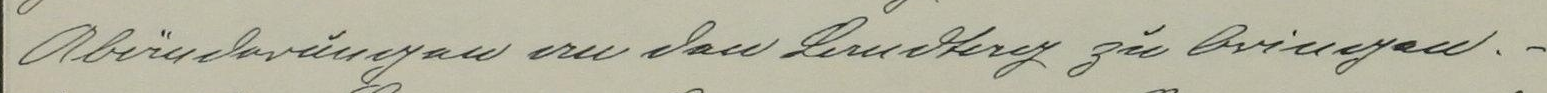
Abänderungen an den Landtag zu bringen.
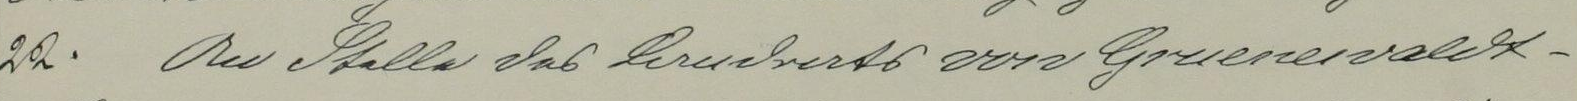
22. An Stelle des Landrats von Gruenewaldt-
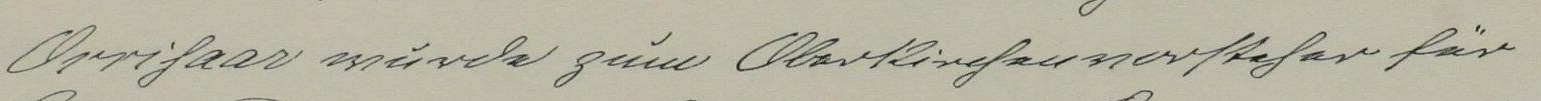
Orrisaar wurde zum Oberkirchenvorsteher für
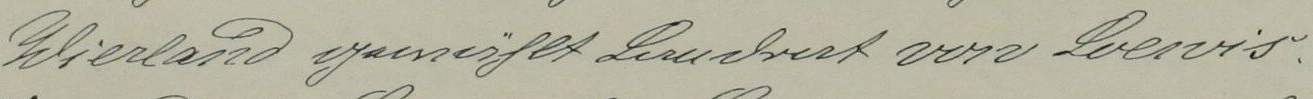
Wierland gewählt Landrat von Loewis.
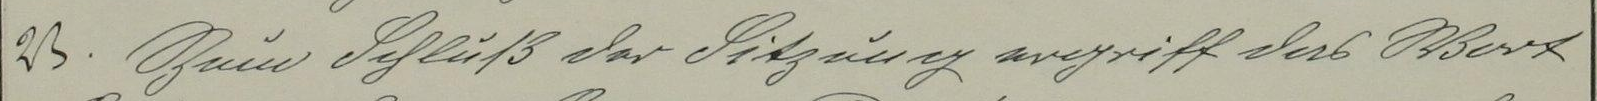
23. Zum Schluß der Sitzung ergriff das Wort
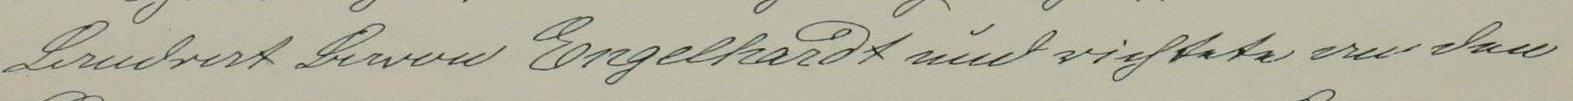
Landrat Baron Engelhardt und richtete an den
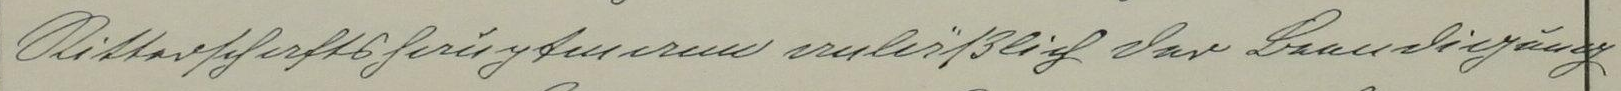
Ritterschaftshauptmann anläßlich der Beendigung
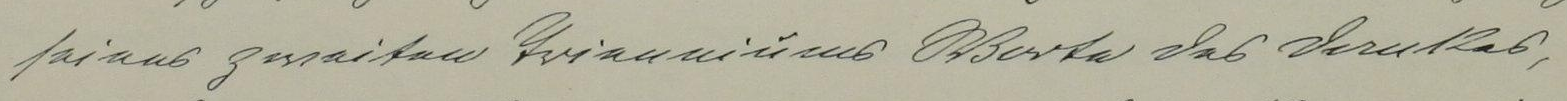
seines zweiten Trienniums Worte des Dankes,
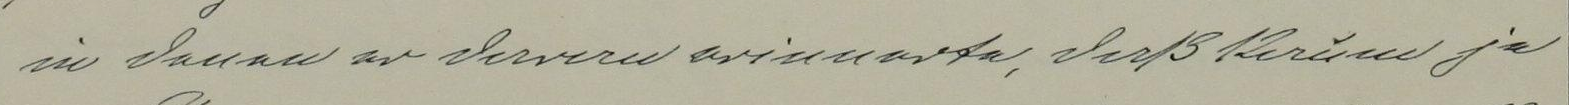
in denen er daran erinnerte, daß kaum je
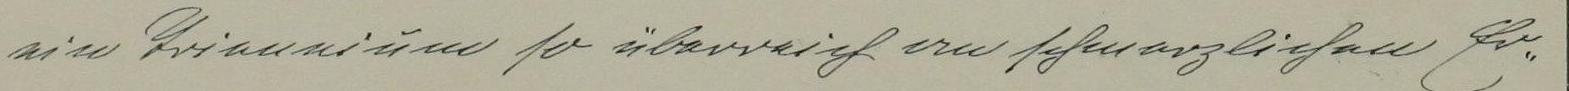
ein Triennium so überreich an schmerzlichen Er-
